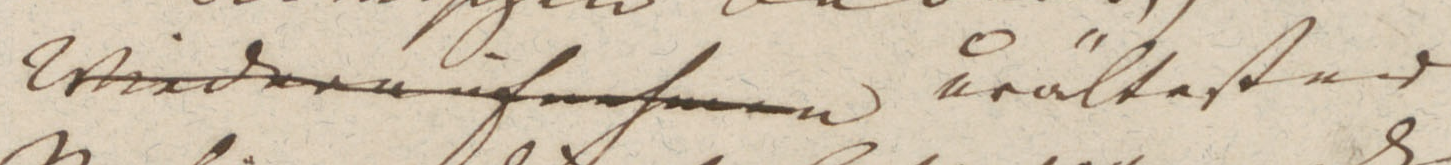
Wiederaufnehmen urältester
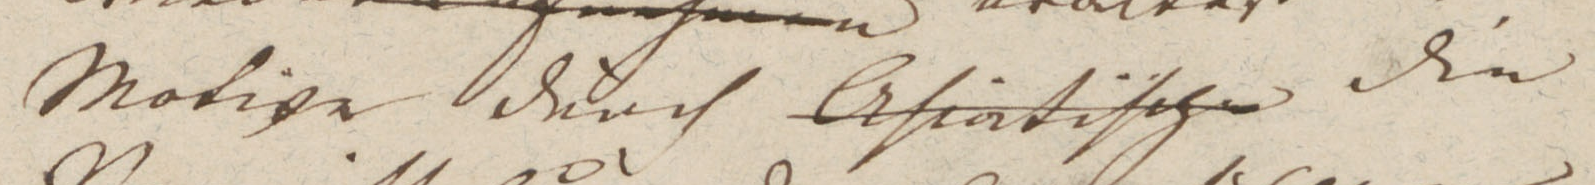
Motive durch Asiatische die
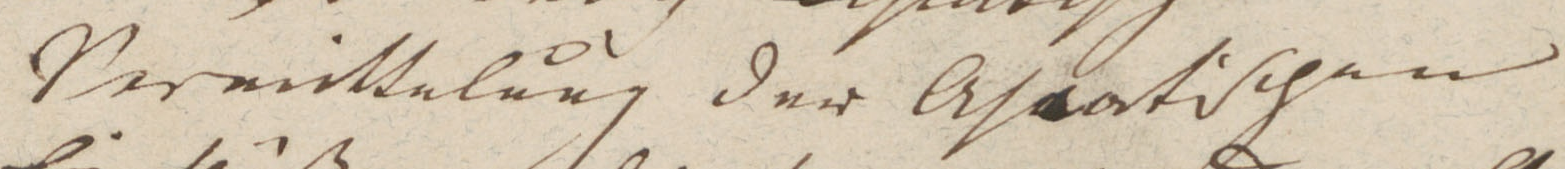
Vermittlung der Asaiatischen
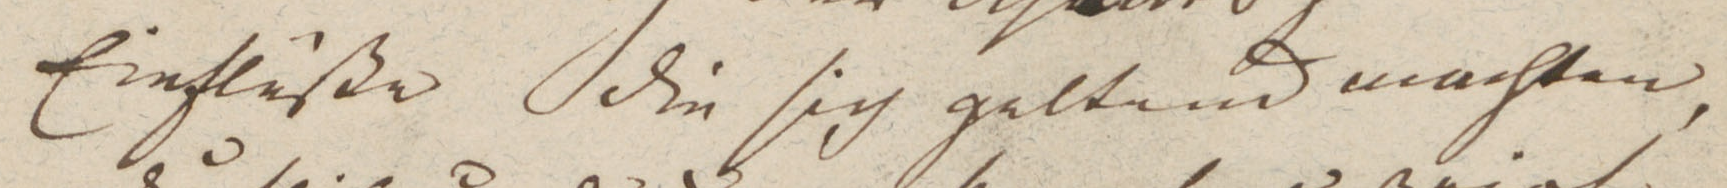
Einflüsse die sich geltend machten,
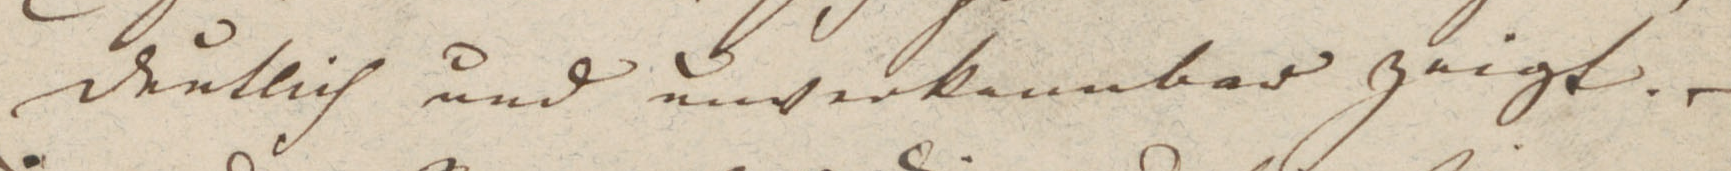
deutlich und unverkennbar zeigt. –
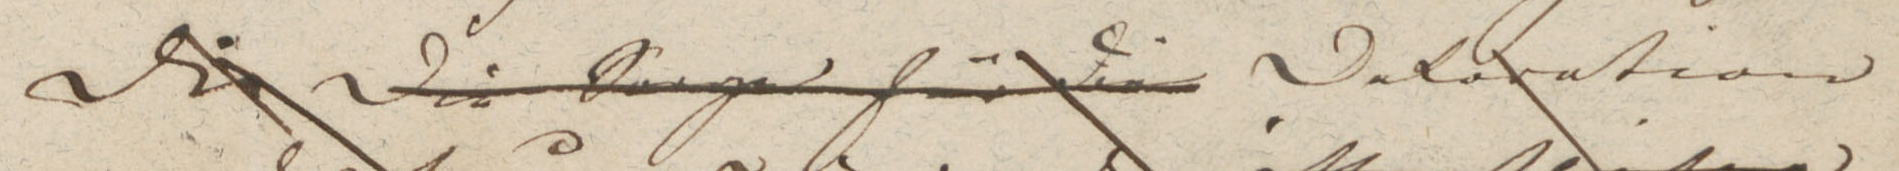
Die Die S für die Dekoration
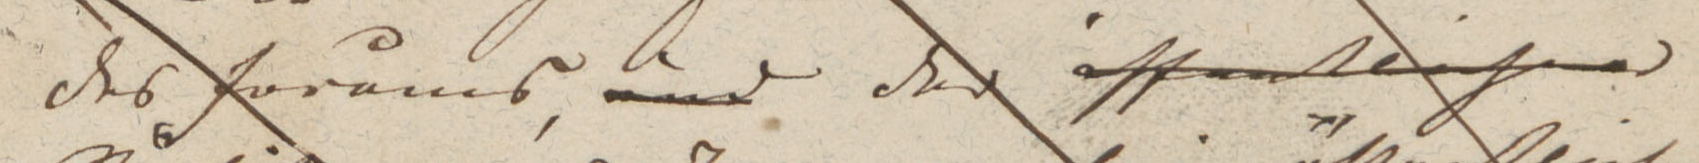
des Forums, und der öffentlichen
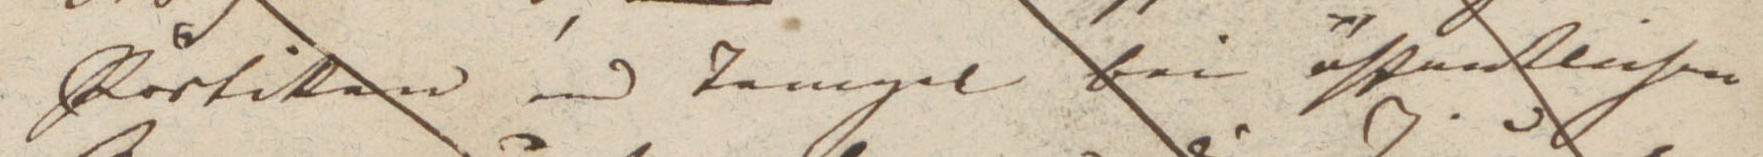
Portiken und Tempel bei öffentlichen
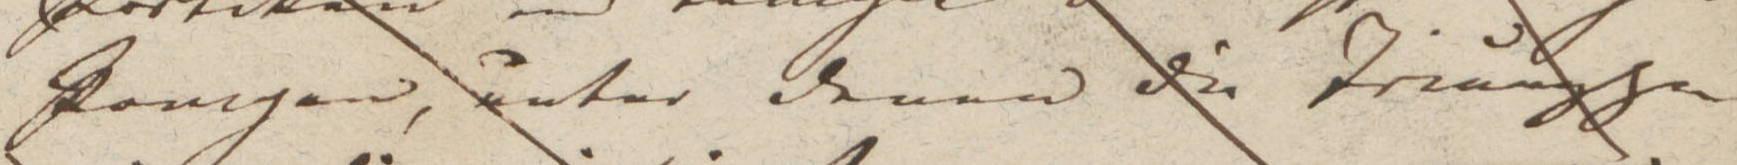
Pompen, unter denen die Triumph-
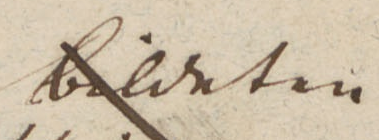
bildeten
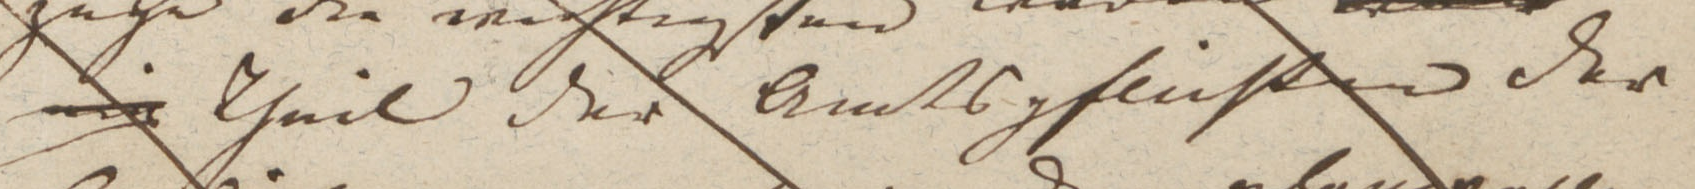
ein Theil der Amtspflichten der
